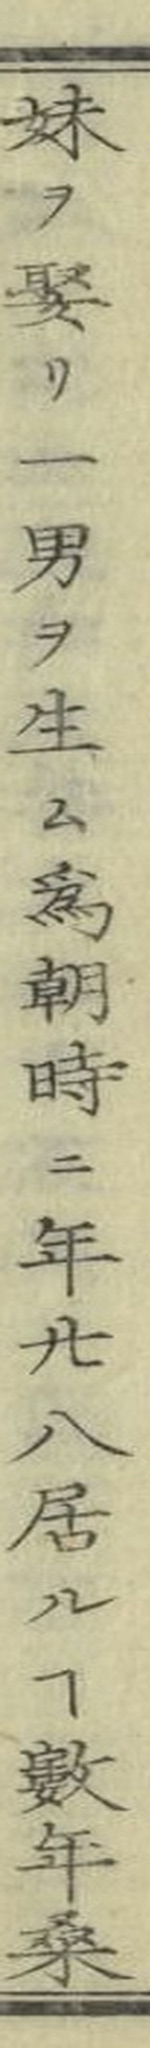妹ヲ娶リ一男ヲ生ム爲朝時ニ年廿八居ルコト數年桑
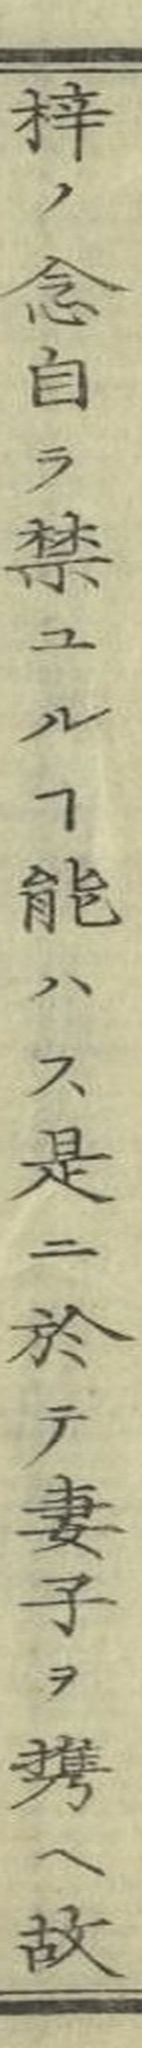梓ノ念自ラ禁ツルコト能ハス是ニ於テ妻子ヲ携ヘ故
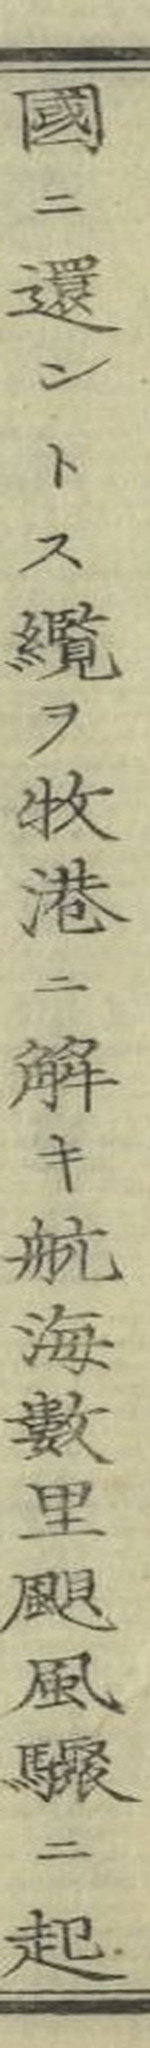國ニ還ントス䌫ヲ牧港ニ解キ航海數里颶風驟ニ起
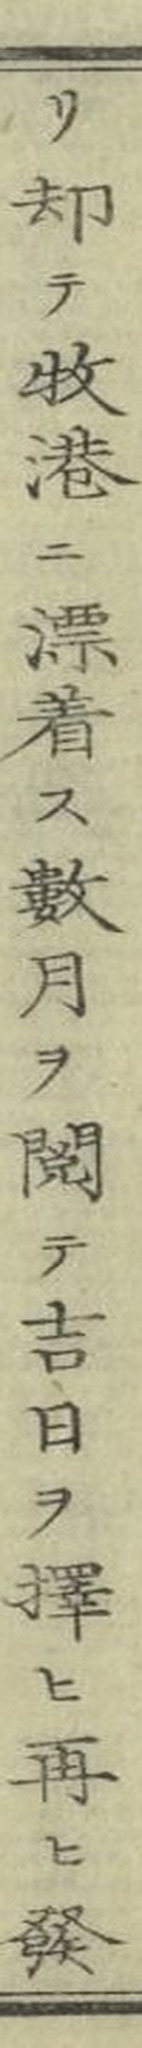リ却テ牧港ニ漂着ス數月ヲ閲テ吉日ヲ擇ヒ再ヒ發
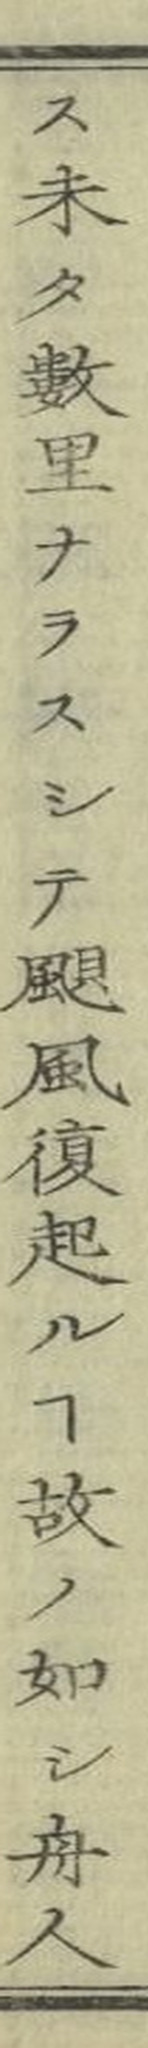ス未タ數里ナラスシテ颶風復起ルコト故ノ如シ舟人
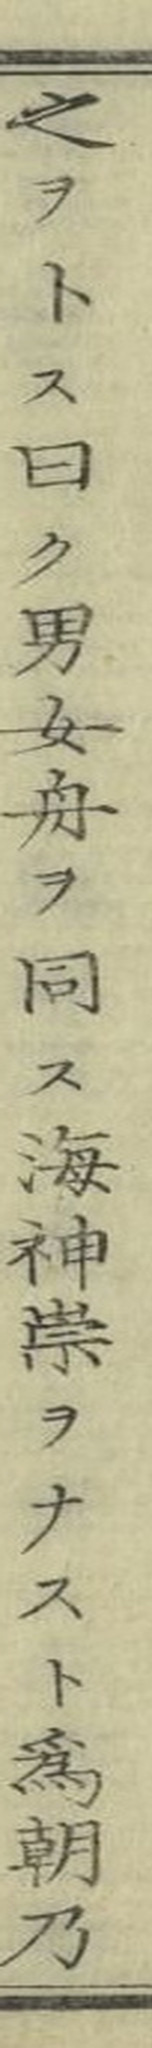之ヲ卜ス曰ク男女舟ヲ同ス海神崇ヲナスト爲朝乃
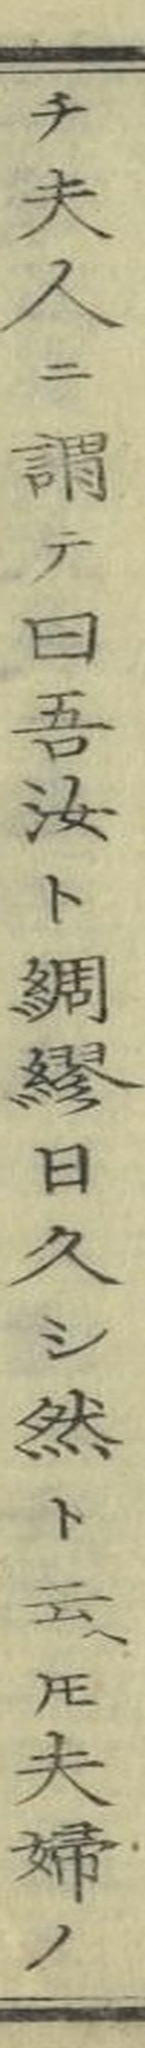チ夫人ニ謂テ曰吾汝ト綢繆日久シ然ト云トモ夫婦ノ

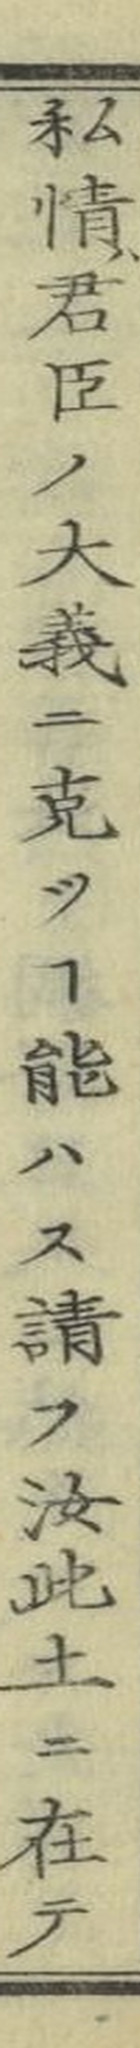私情君臣ノ大義ニ克ツコト能ハス請フ汝此土ニ在テ
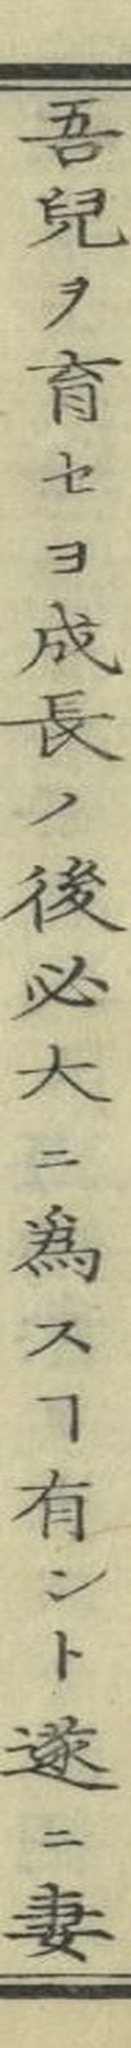吾兒ヲ育セヨ成長ノ後必大ニ爲スコト有ント遂ニ妻
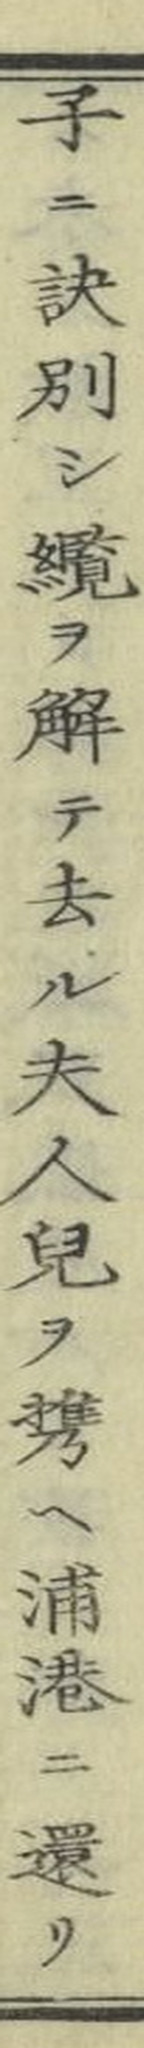子ニ訣别シ纜ヲ解テ去ル夫人兒ヲ携ヘ浦港ニ還リ
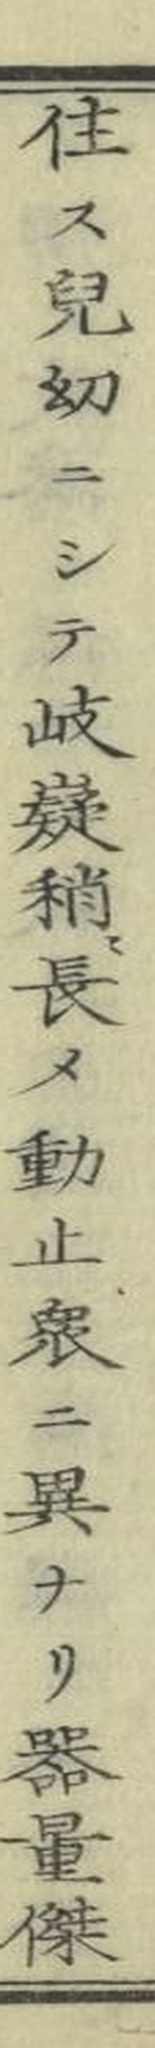住ス兒幼ニシテ岐嶷稍〻長シテ動止衆ニ異ナリ器量傑
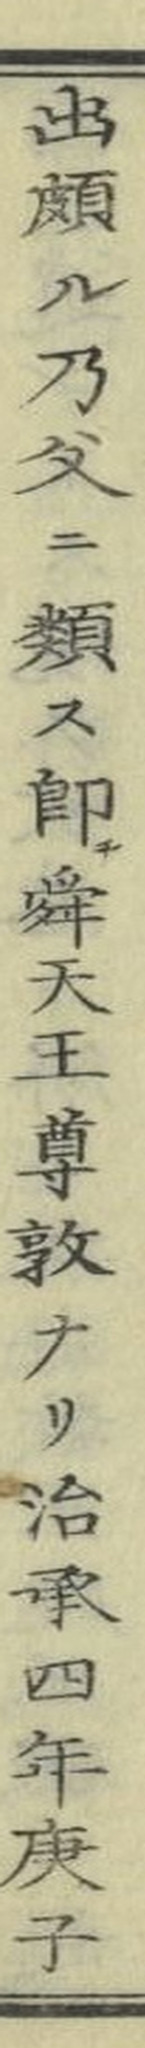出頗ル乃父ニ類ス即舜天王尊敦ナリ治承四年庚子
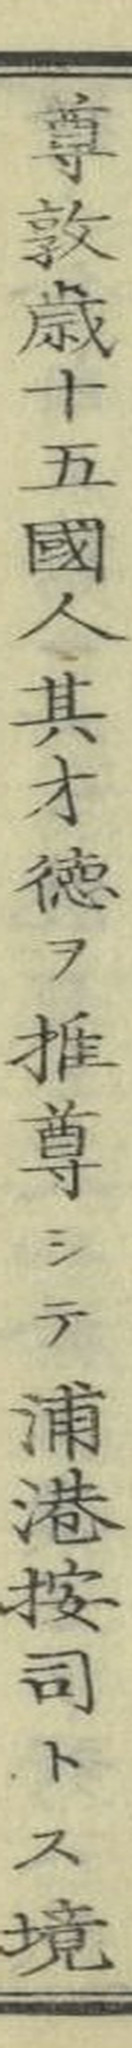尊敦歳十五國人其才德ヲ推尊シテ浦港按司卜ス境
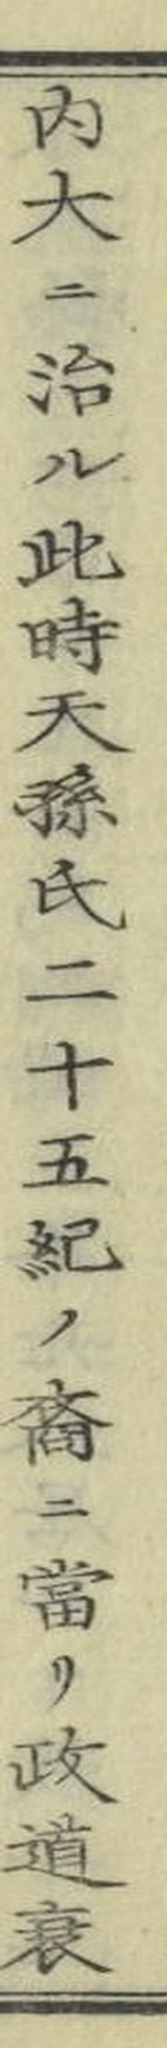內大ニ治ル此時天孫氏二十五紀ノ裔ニ當リ政道衰
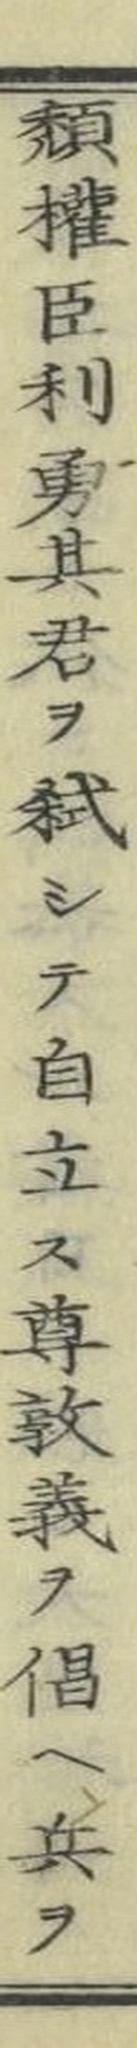頽權臣利勇其君ヲ弑シテ自立ス尊敦義ヲ倡ヘ兵ヲ
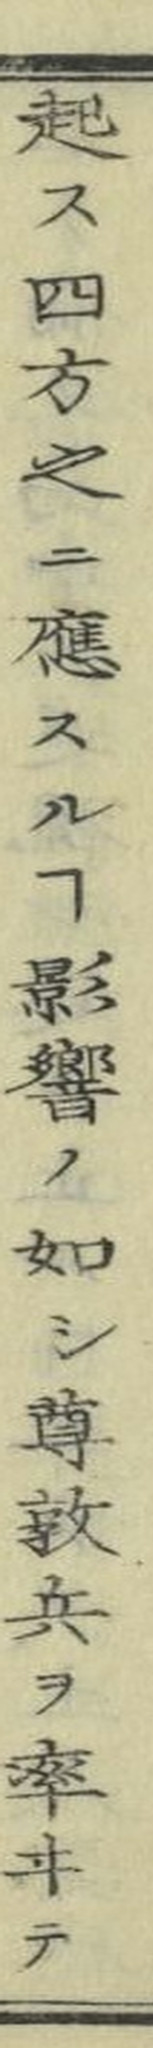起ス四方之ニ應スルコト影響ノ如シ尊敦兵ヲ率ヰテ
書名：琉球藩史 一之巻
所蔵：University of the Ryukyus Library
